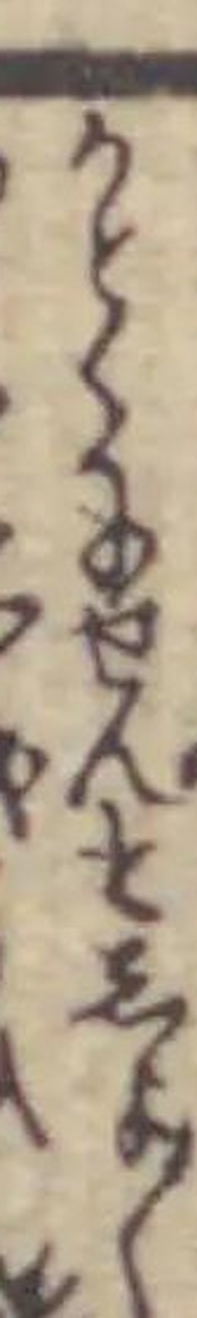かとくにせんとしよ〳〵
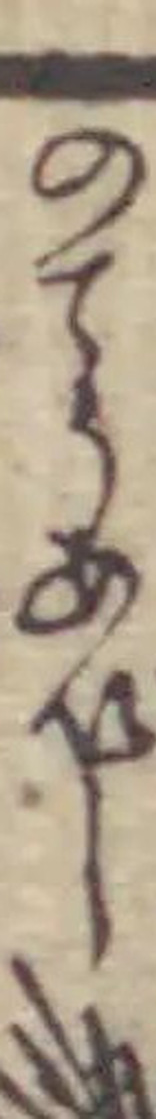のてうあいし
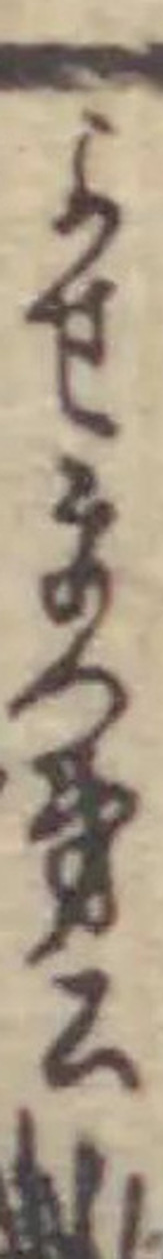よせまつ弟公
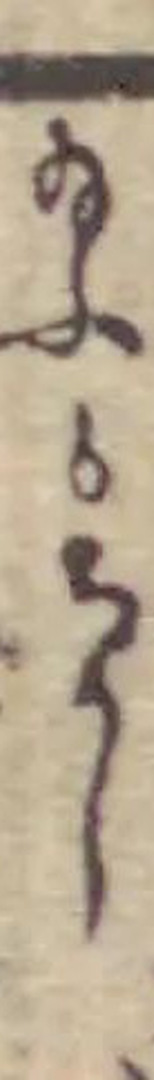給ふもちかし
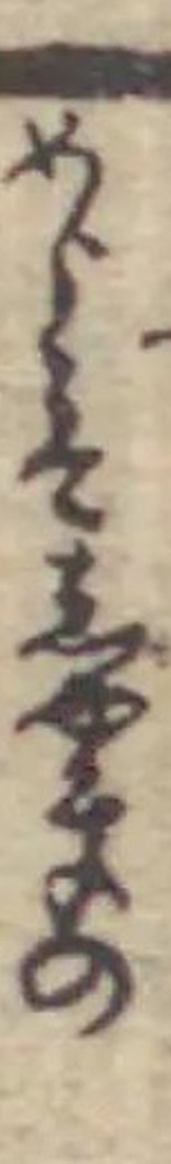めらこそしやまの
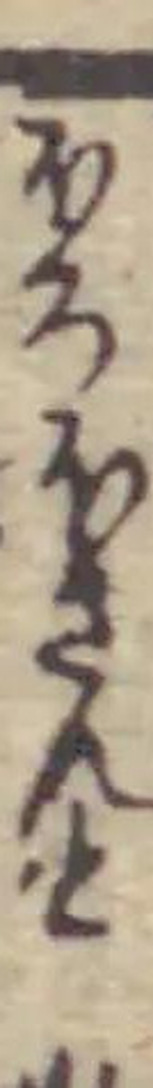ほろほさんと
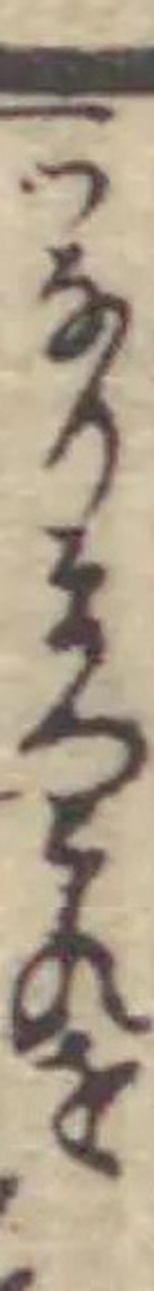一つなりまつこれを
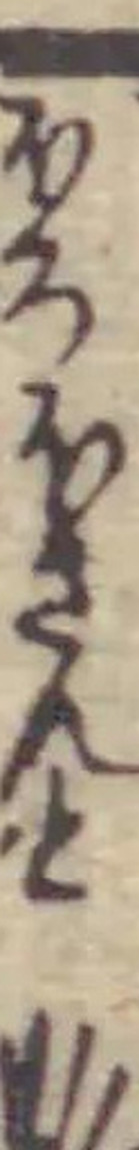ほろほさんと
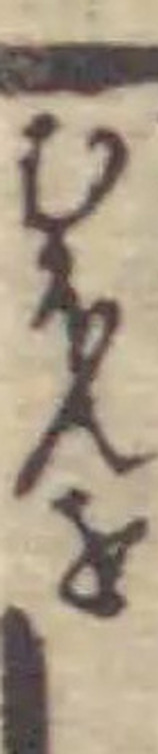むほんを
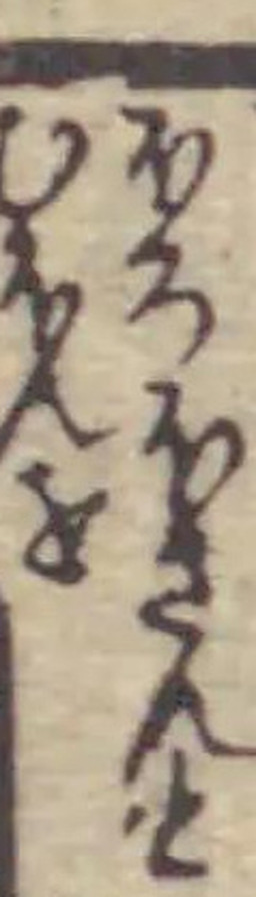むほんを
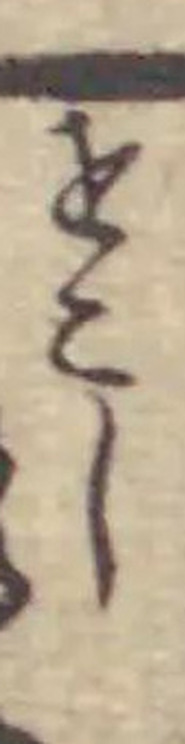をこし
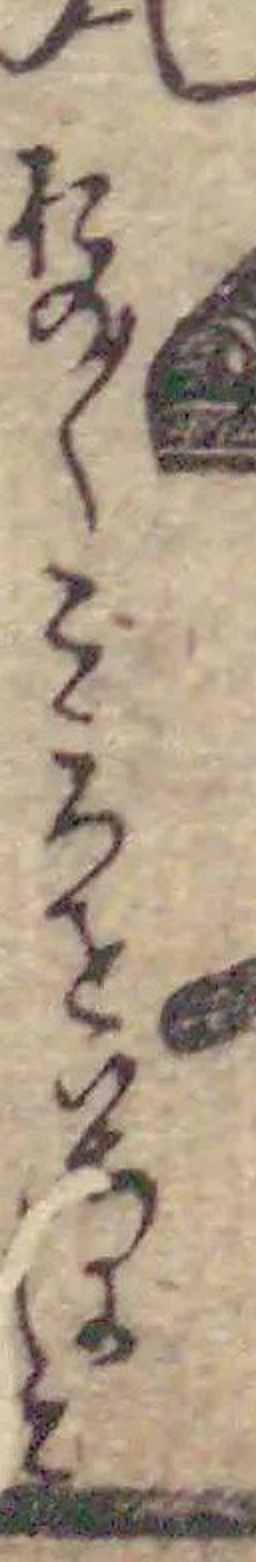おの〳〵こゝろをいちにして
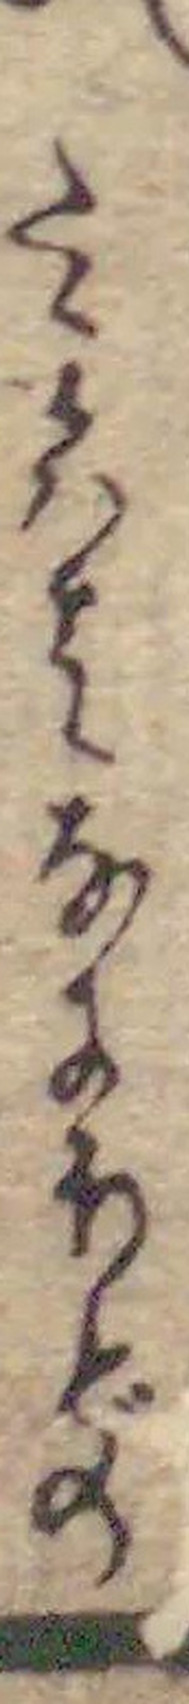たゝかははなにほどの
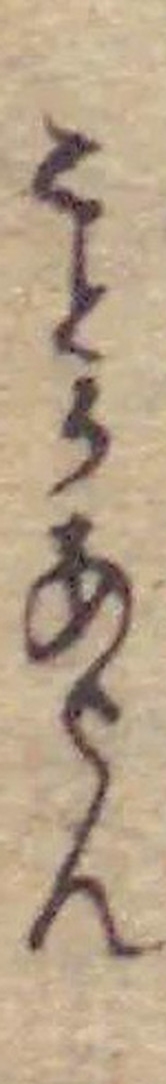ことかあらん

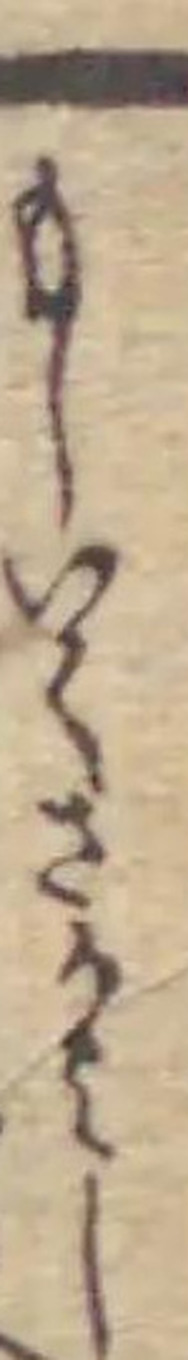もしいくさかはし
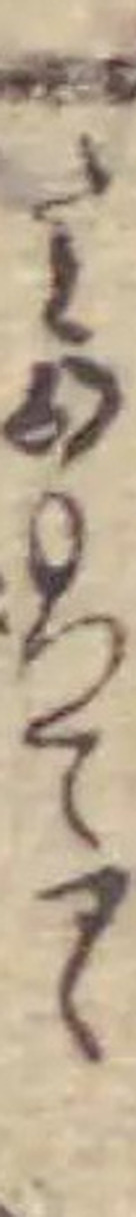たとおもつてアゝ
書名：餅酒腹中能同志 2巻
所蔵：国立国会図書館 National Diet Library, JAPAN
